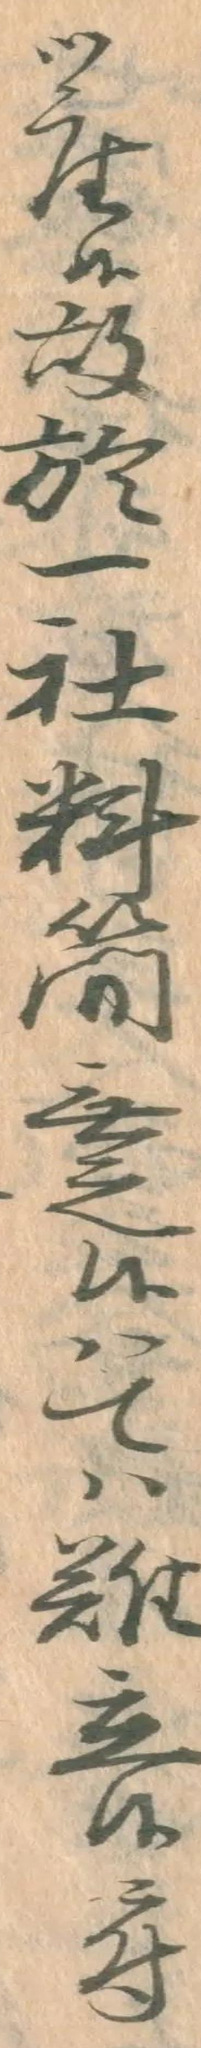御座候故於一社料簡無之候ハてハ難立候ニ付
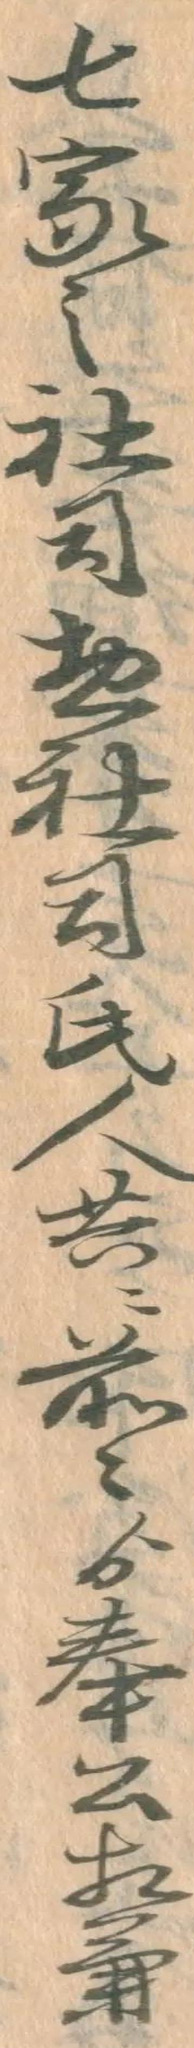七家之社司惣社司氏人共ニ前々ゟ奉公相兼
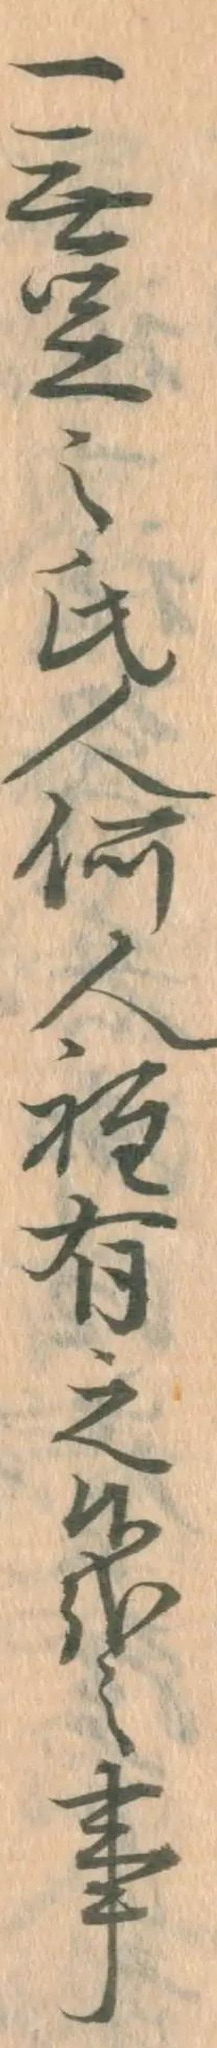一、無足之氏人何人程有之候哉之事
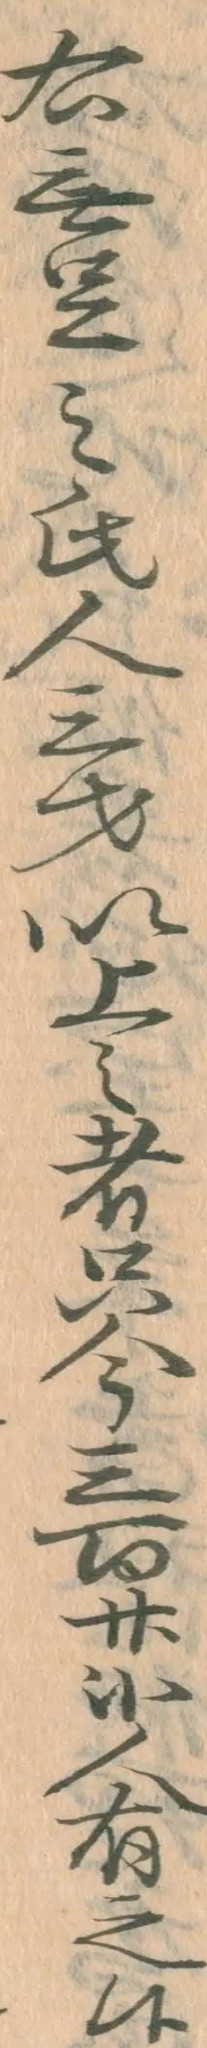右無足之氏人三才以上之者只今三百廿弐人有之候
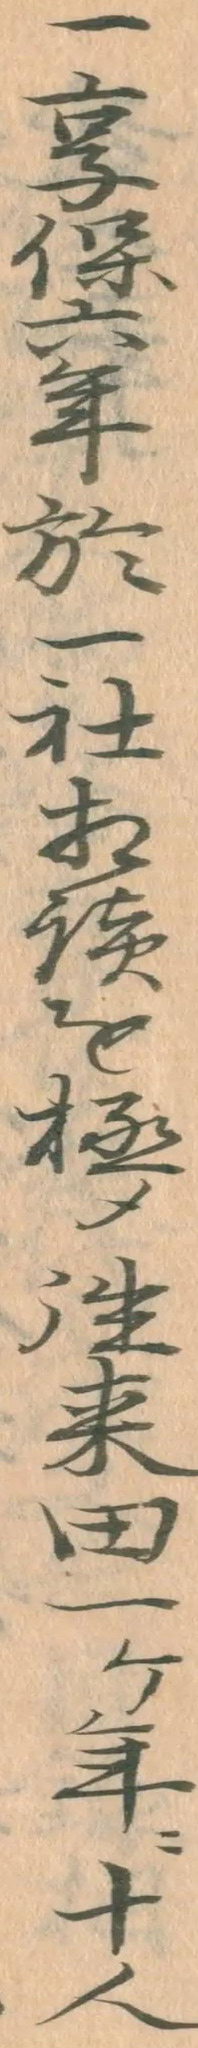一、享保六年於一社相談を極メ往来田一ヶ年に十人
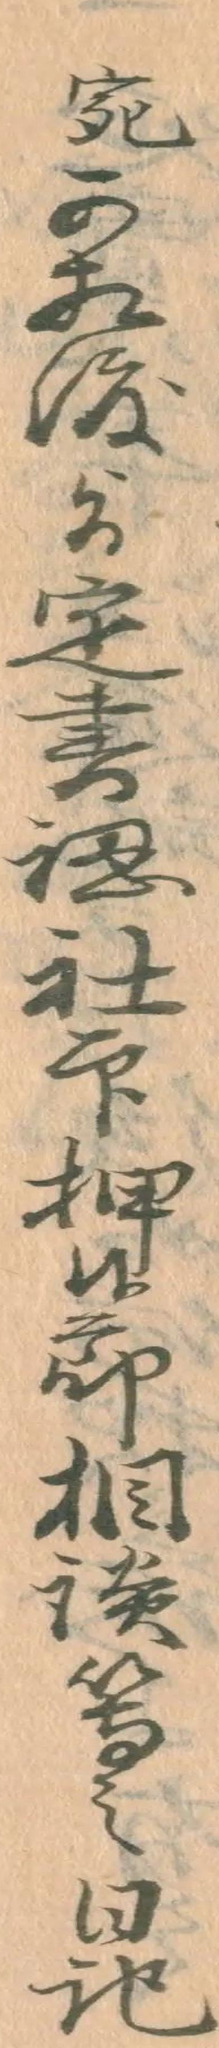宛可相渡旨定書認社印押候節相談等之日記
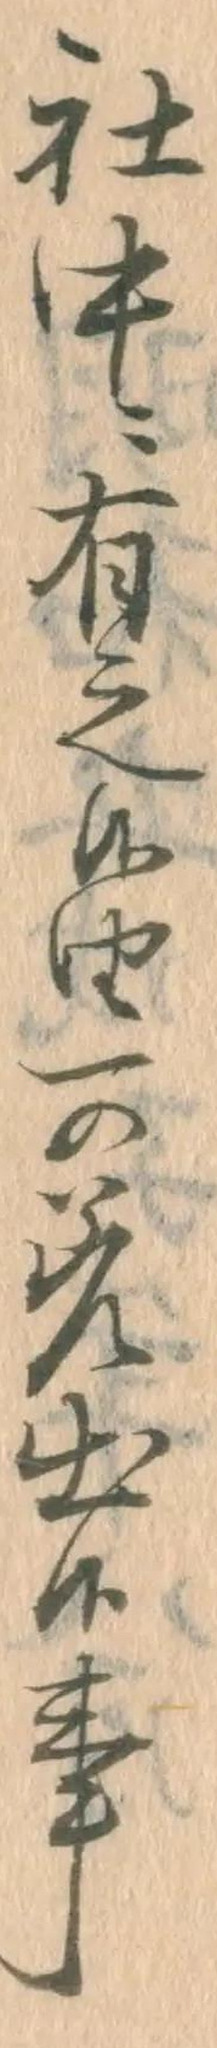社中ニ有之候由可差出候事
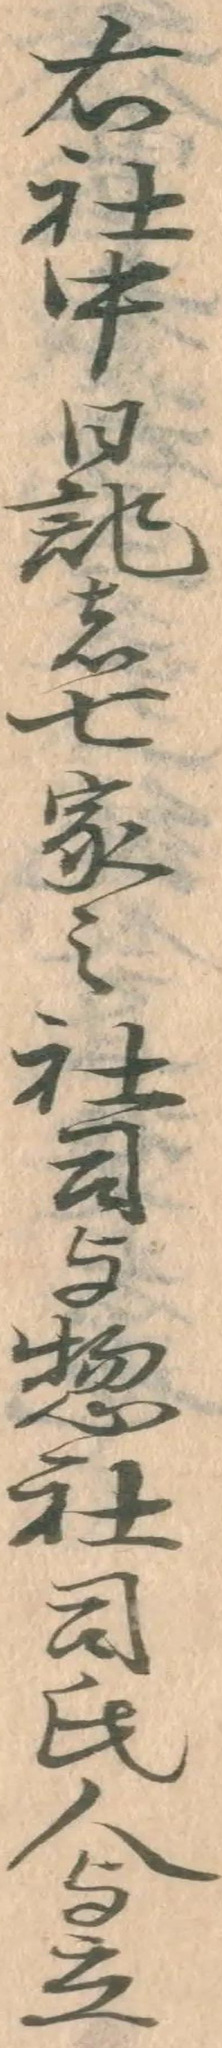右社中日記者七家之社司与惣社司氏人与立
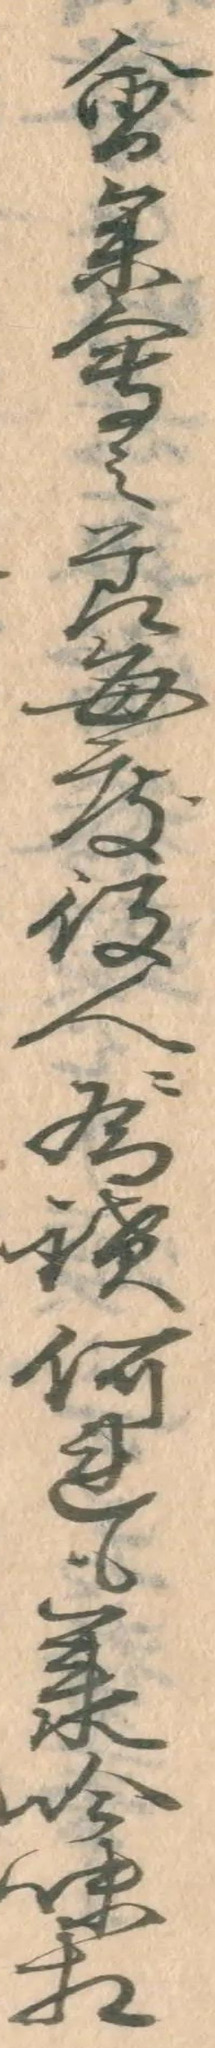會参会之節毎度役人ニ為談何れも承吟味相
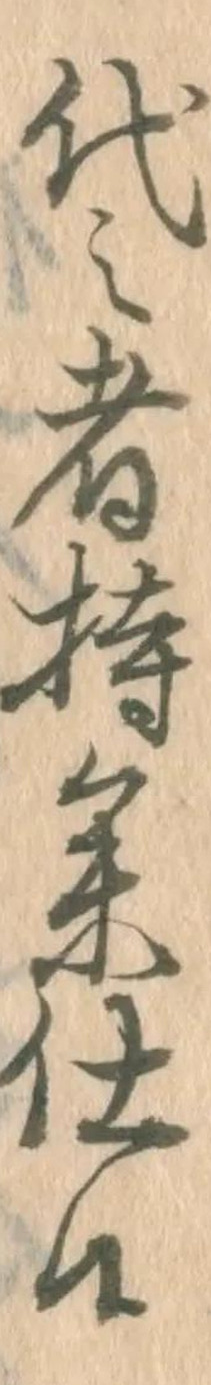代之者持参仕候
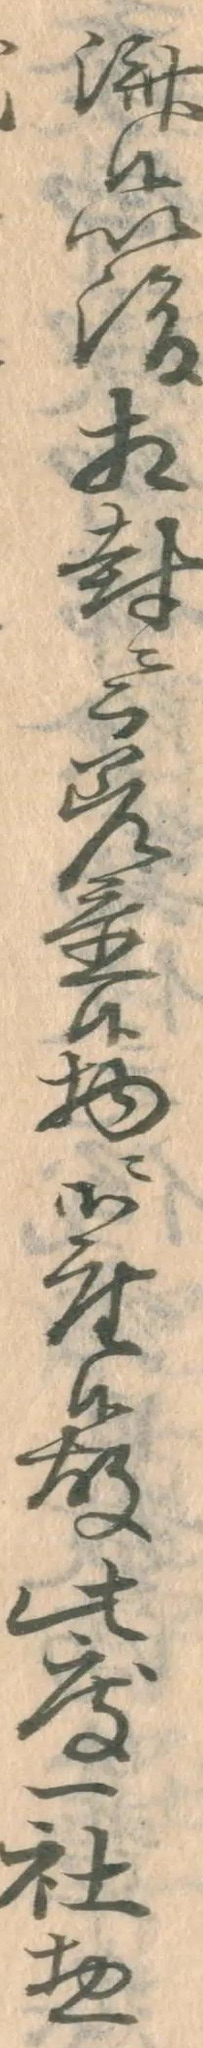済候以後相封ニ而差置候物ニ御座候故此度一社惣
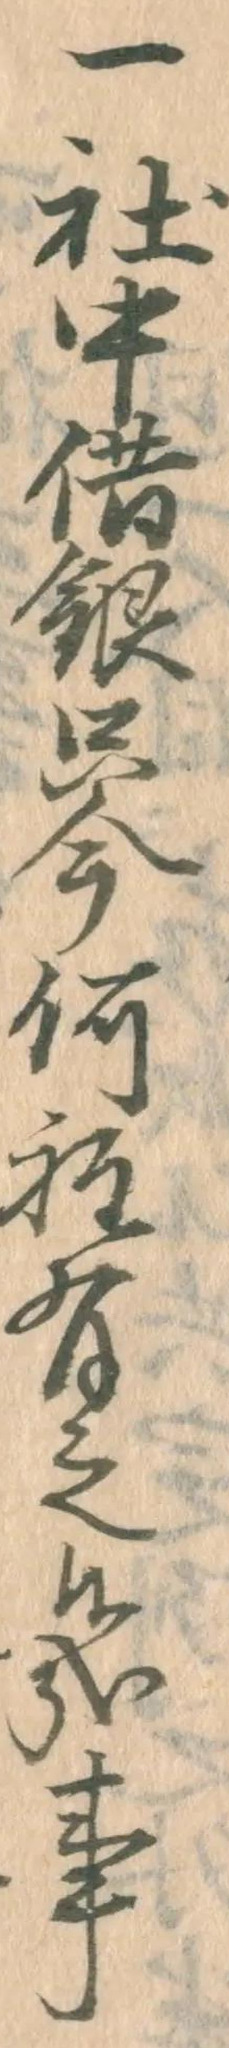一、社中借銀只今何程有之候哉事
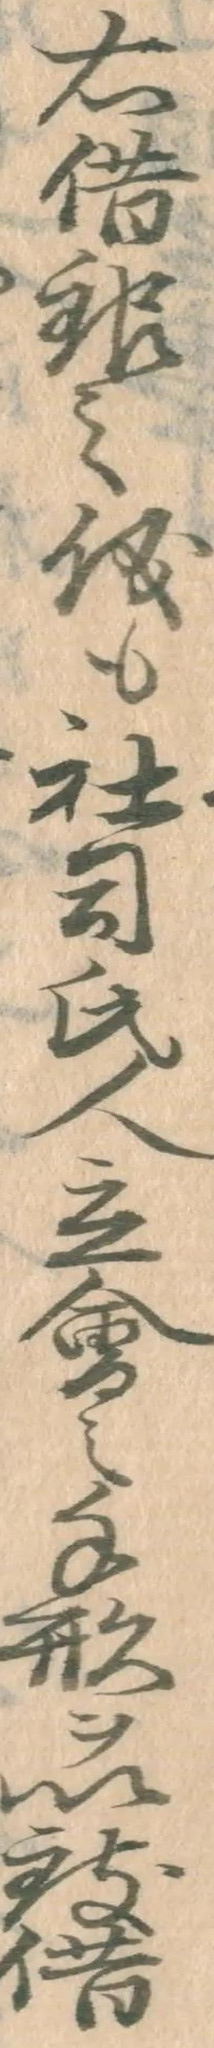右借銀之儀も社司氏人立會之手形ヲ以致借
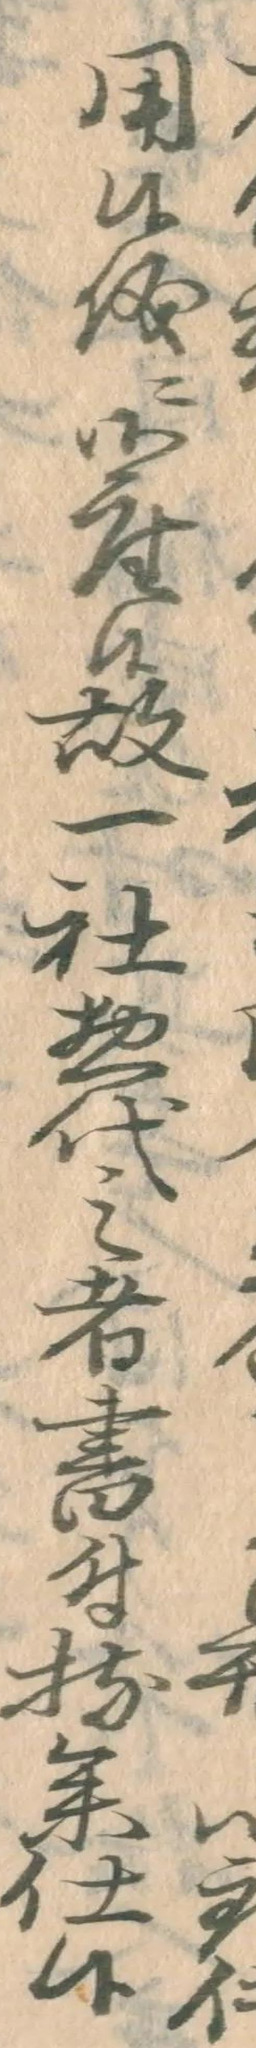用候儀ニ御座候故一社惣代之者書付持参仕候
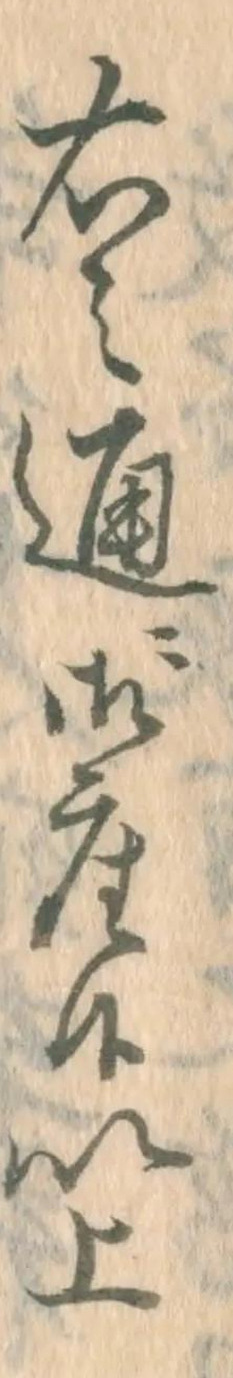右之通ニ御座候以上
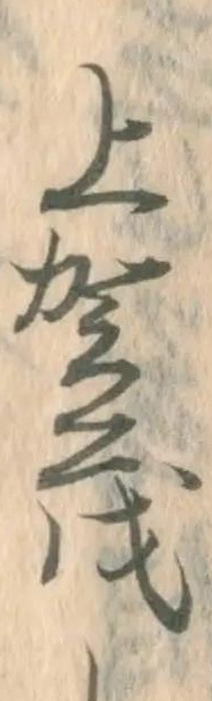上賀茂
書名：賀茂社記録. 第39冊
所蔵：国立国会図書館 National Diet Library, JAPAN
